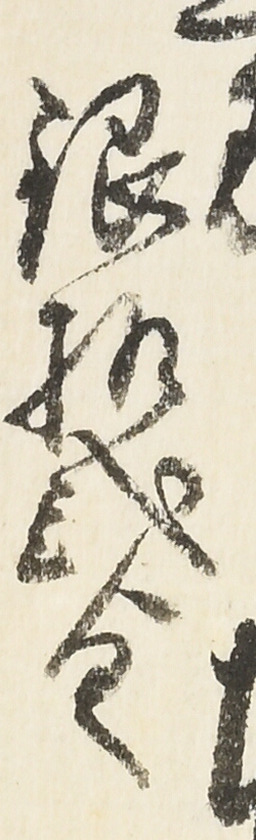銀拾弐匁
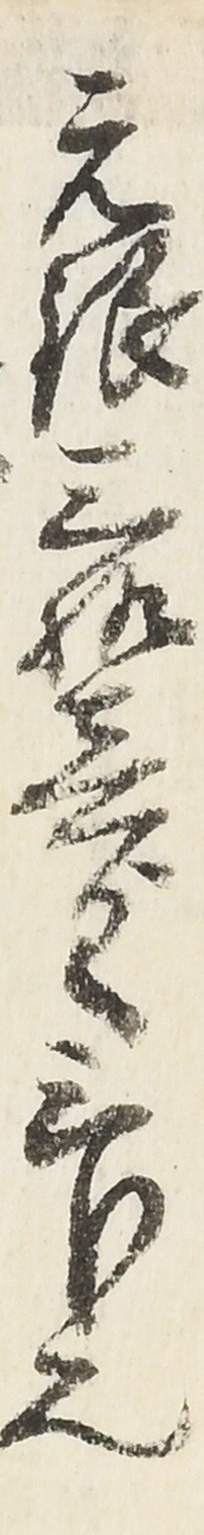元銀三拾壱匁三分也
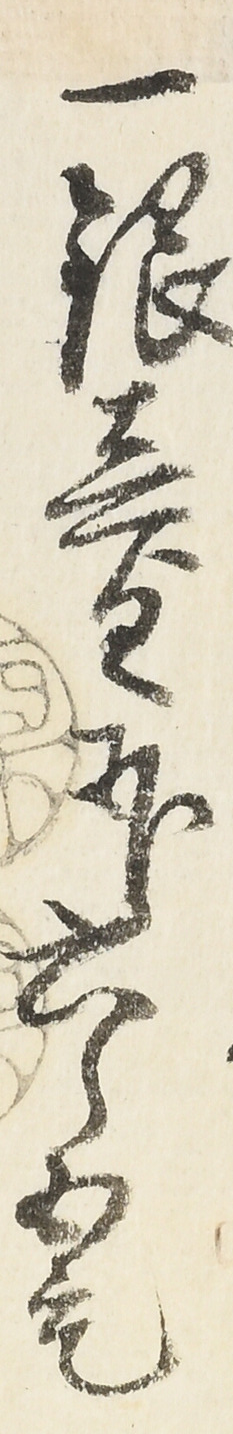一銀壱匁五分六厘五毛
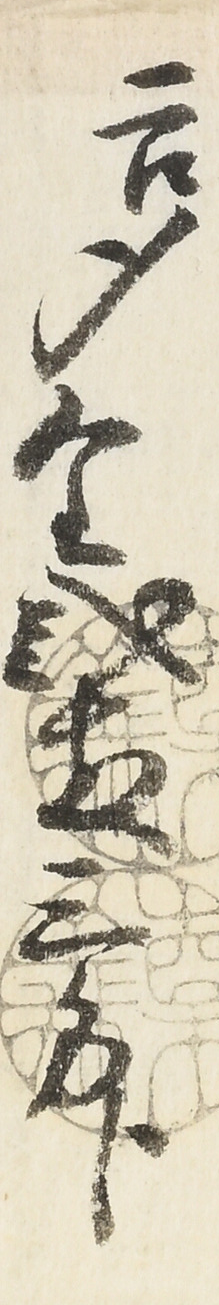二口〆金弐両三分ト
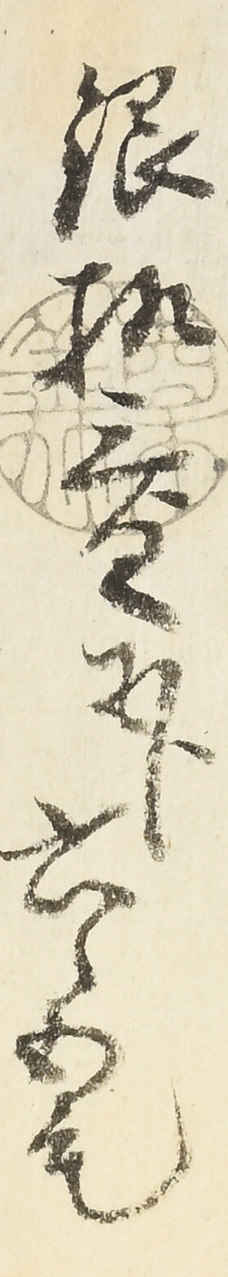銀拾三匁五分六厘五毛

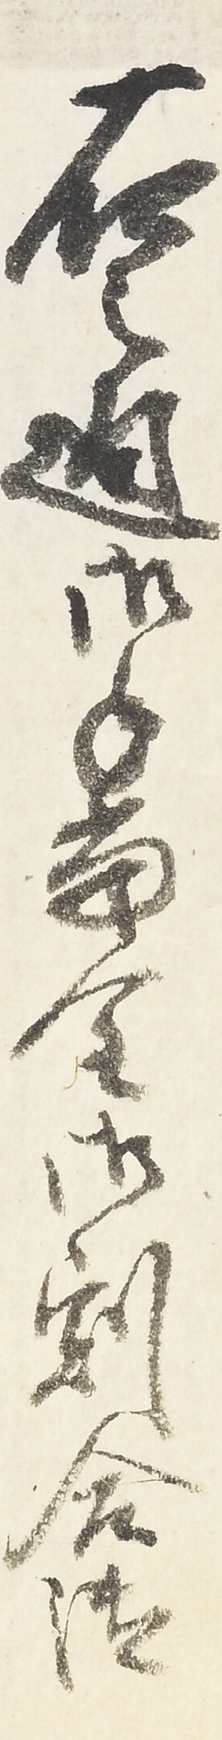右之通御手当金御割合御
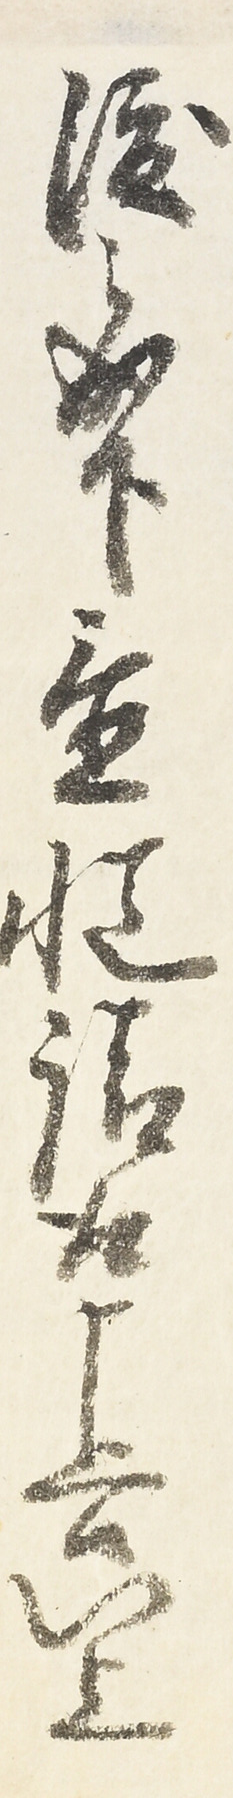渡被成下置慥請取申上候以上
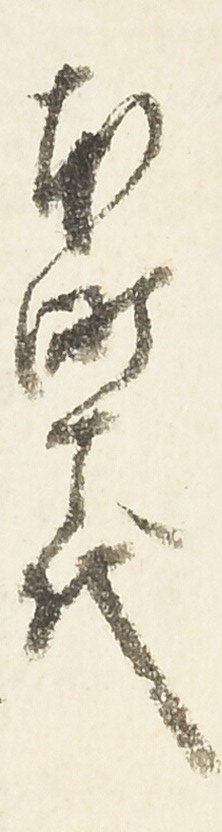本町丁代
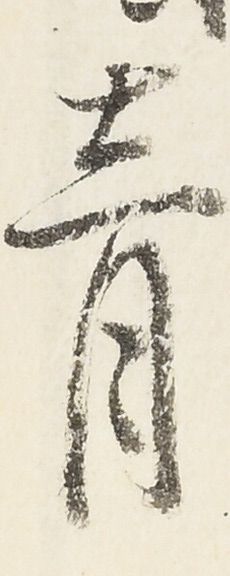十二月
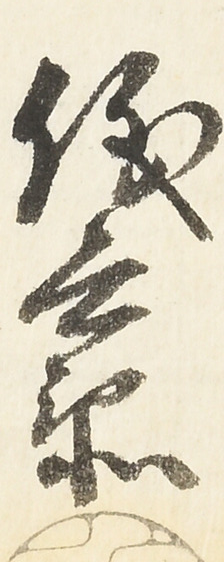儀兵衛
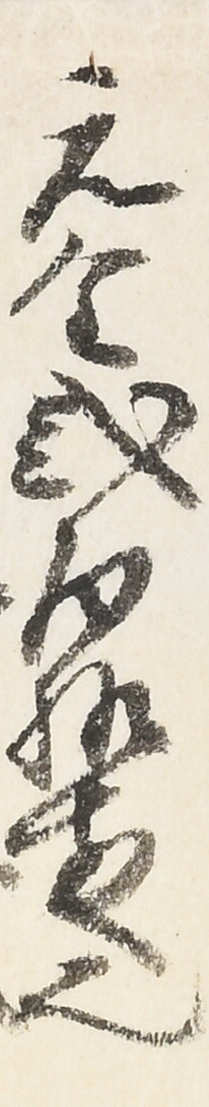元金弐百拾両也
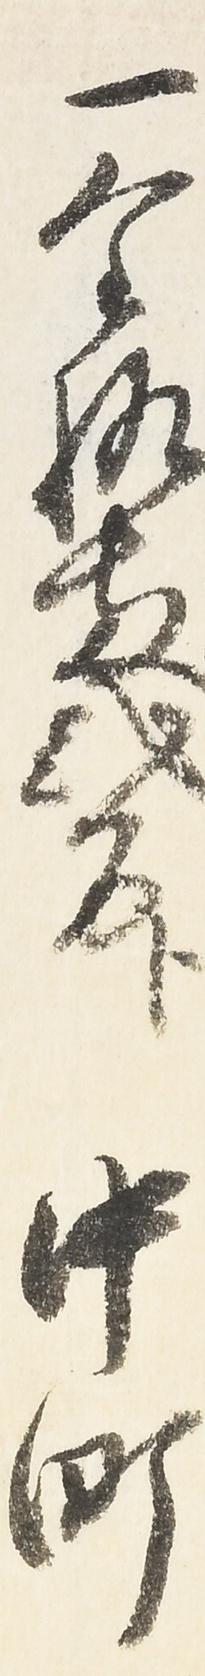一金拾両弐分ト中町
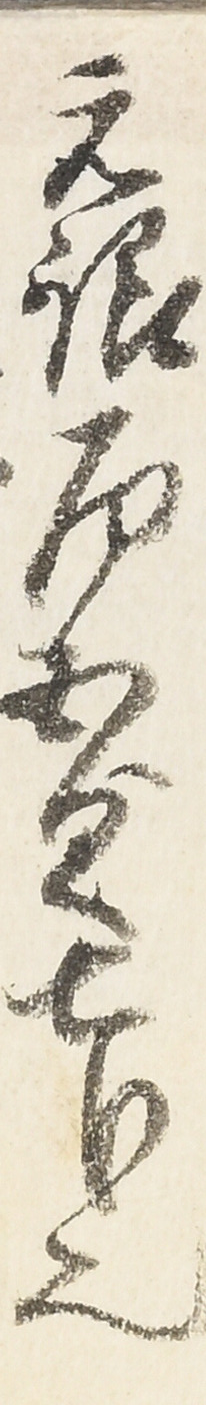元銀百五匁七分也
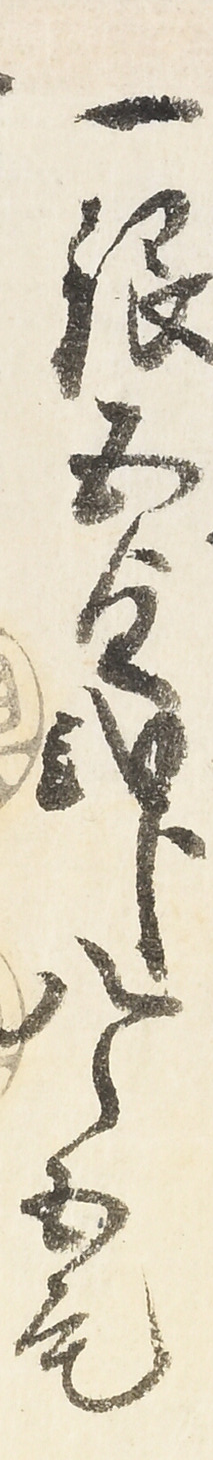一銀五匁弐分八厘五毛
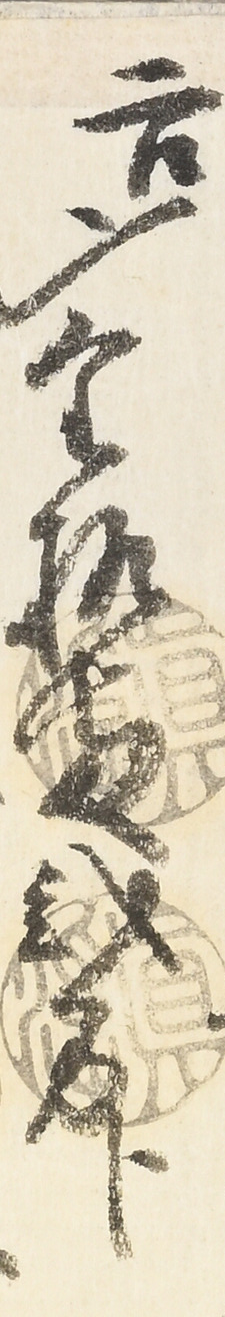二口〆金拾両弐分ト
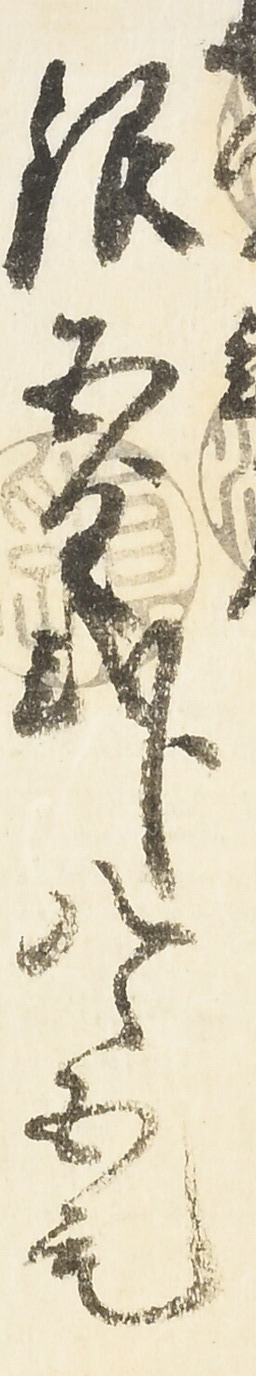銀五匁弐分八厘五毛
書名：御才覚金御利足割渡扣帳
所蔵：伊那市立高遠町図書館・合同会社AMANE
